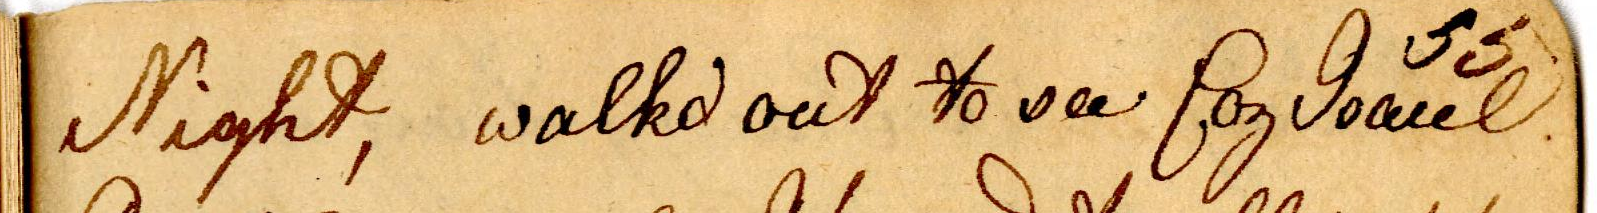Night, walkd out to see Coz Isarel
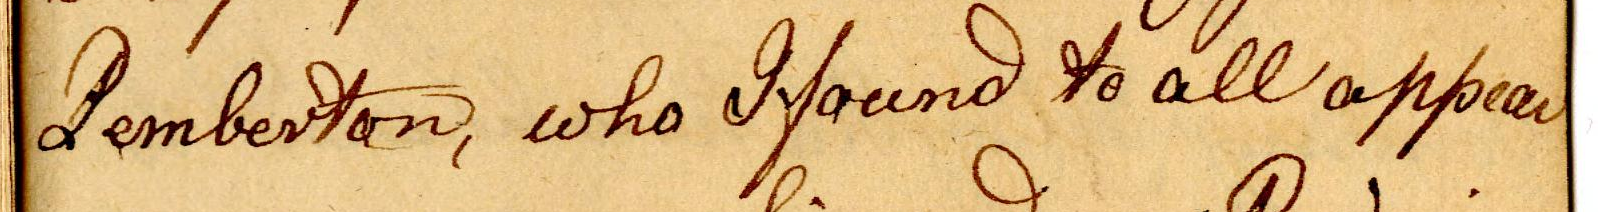Pemberton, who I found to all appear
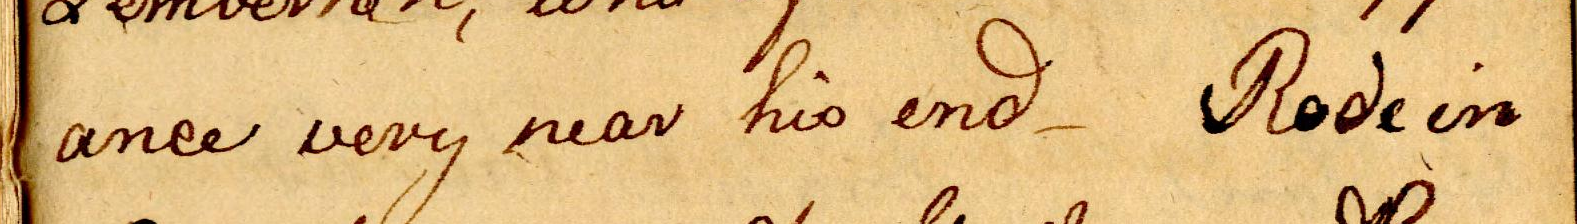ance very near his end- Rode in
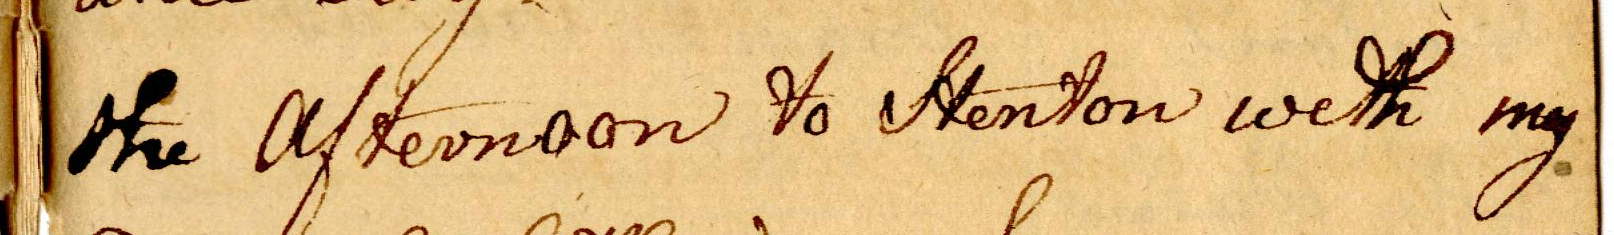the Afternoon to Stenton with my
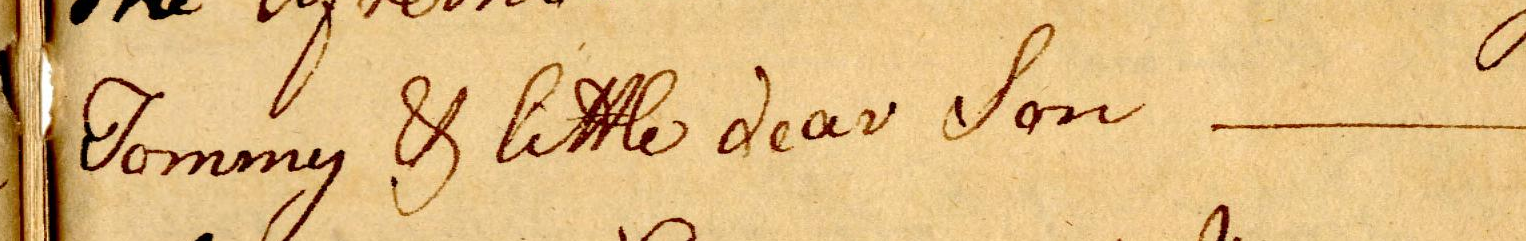Tommy & little dear Son-
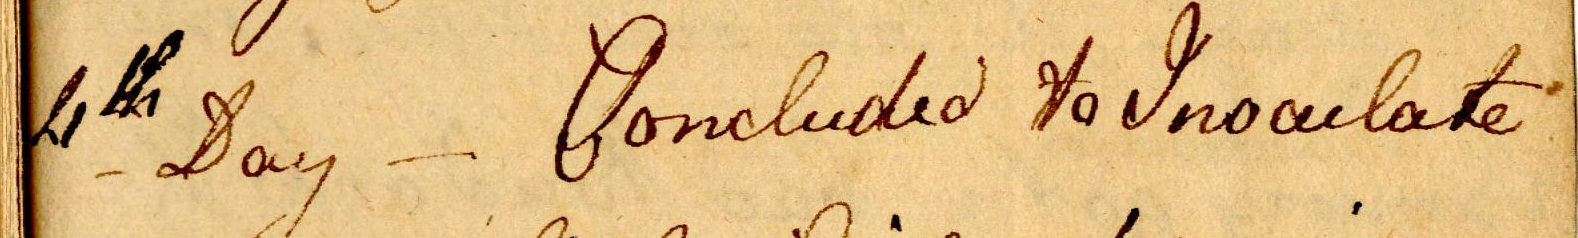4^th Day- Concluded to Inoculate
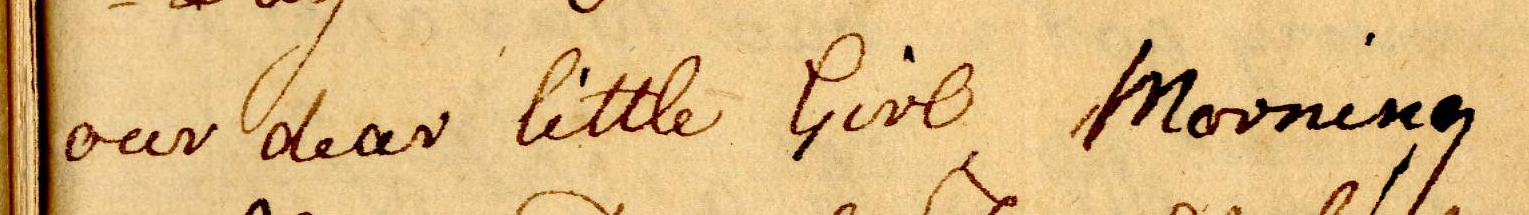our dear little Girl Morning
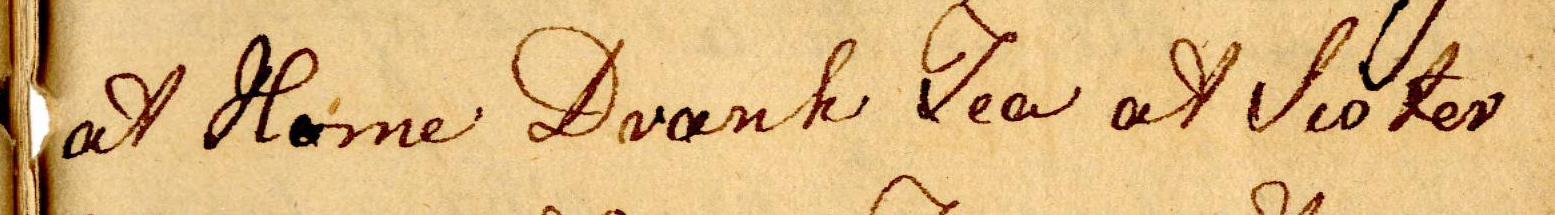at Home Drank Tea at Sister
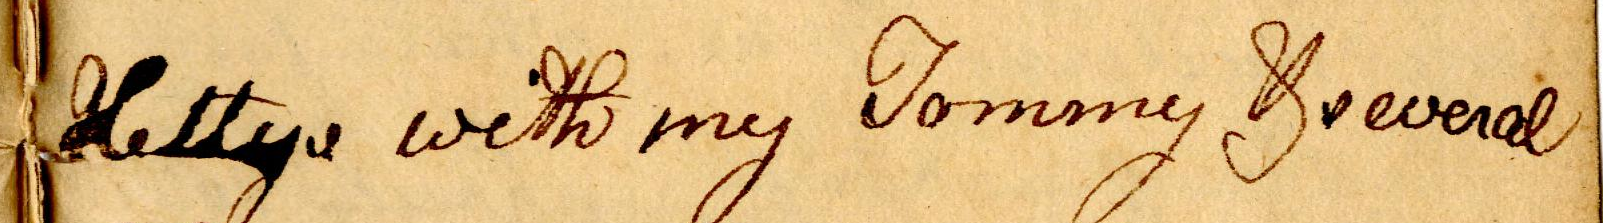Hettys with my Tommy & several
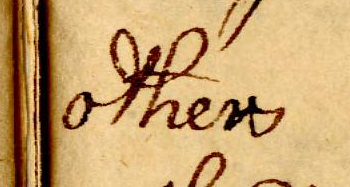others
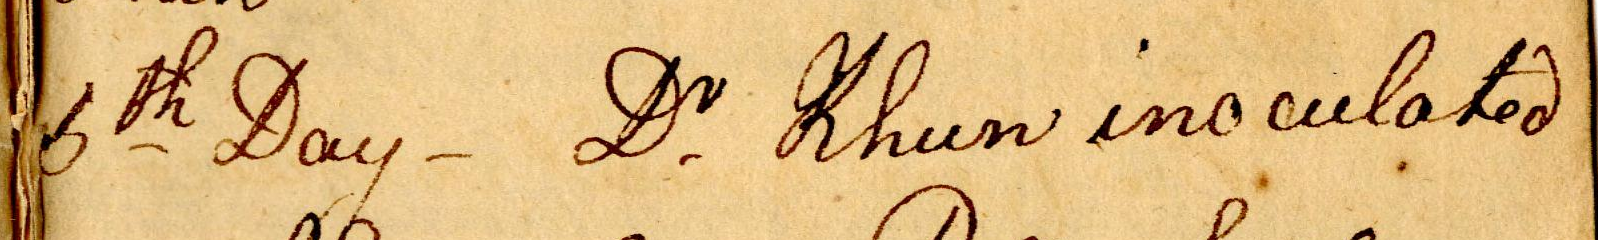5^th Day- D^r. Khun inoculated
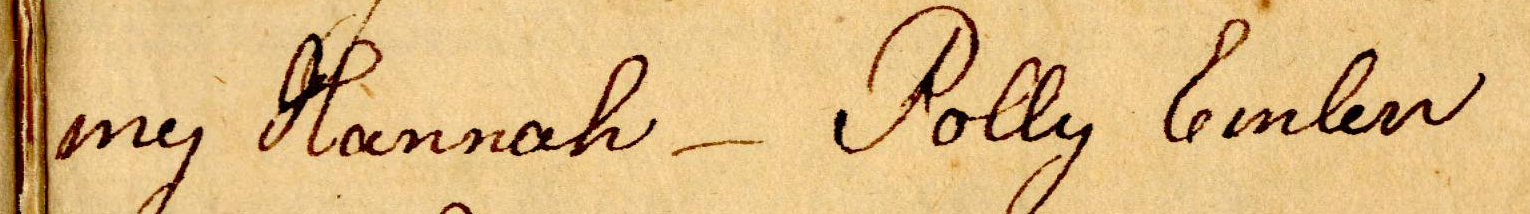my Hannah- Polly Emlen
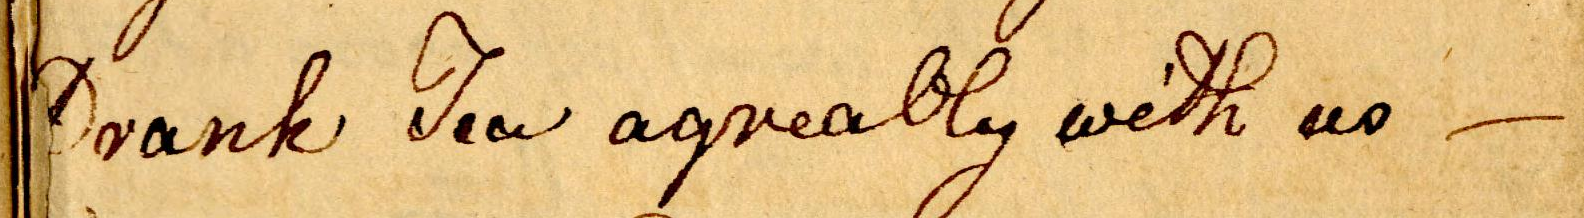Drank Tea agreably with us-
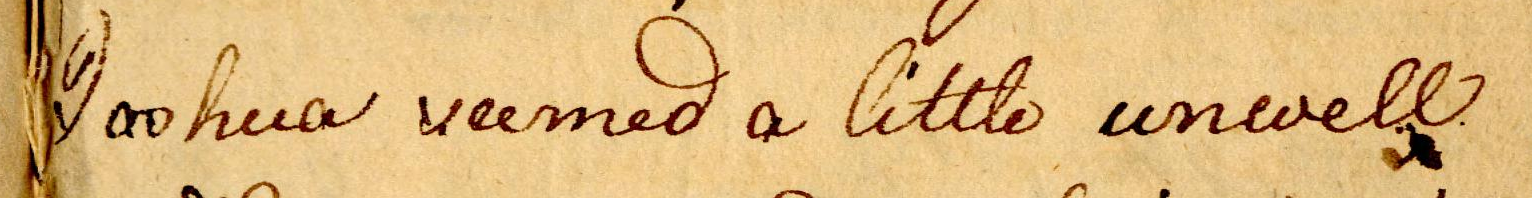Joshua seemed a little unwell
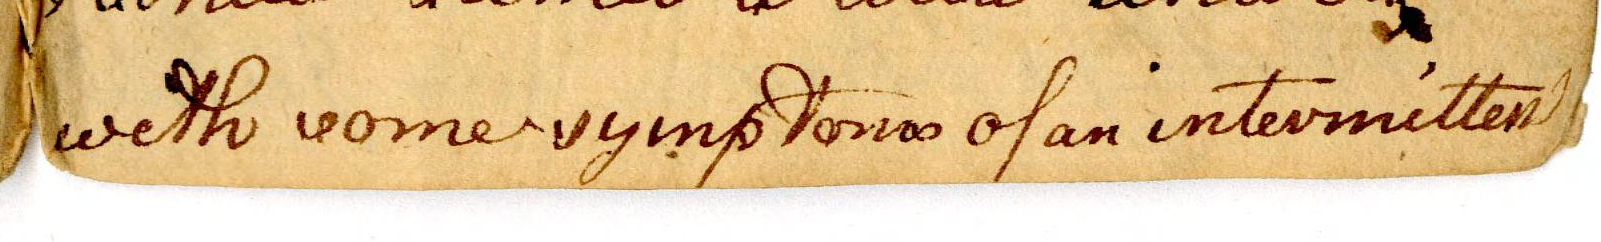with some symptoms of an intermittent
